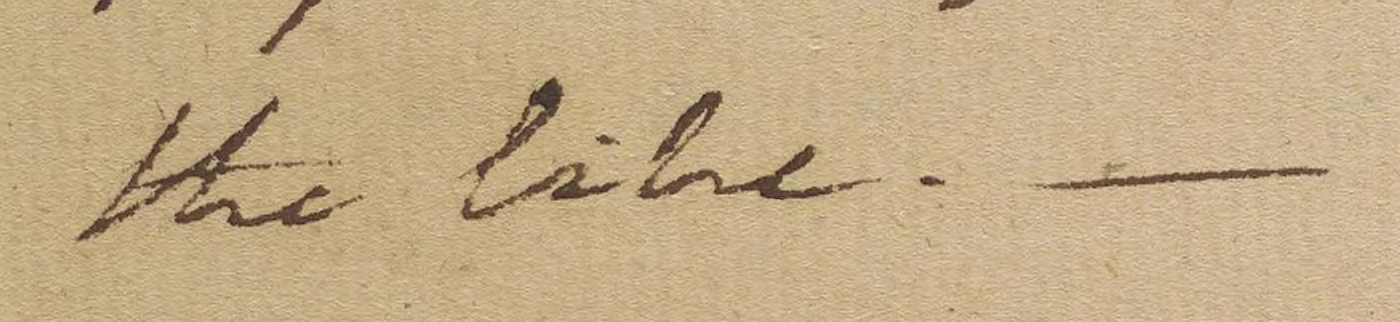the like.-
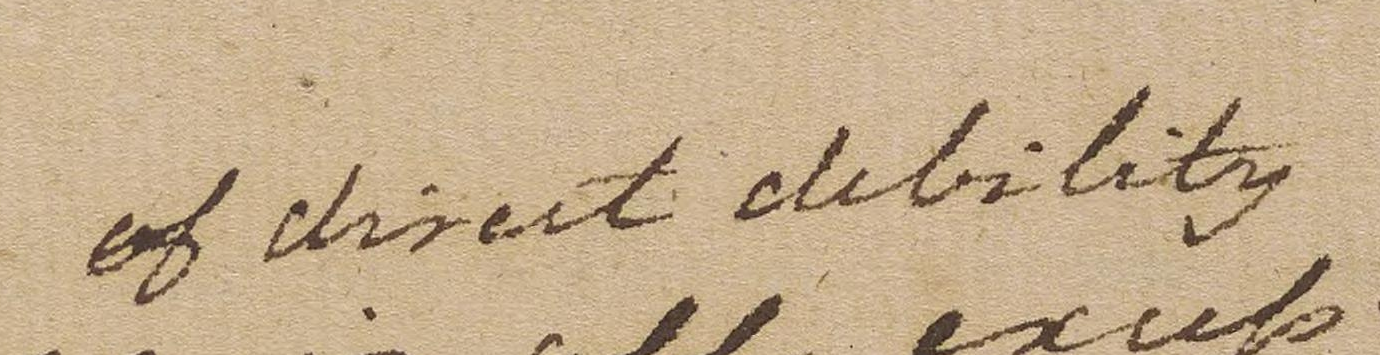of direct debility
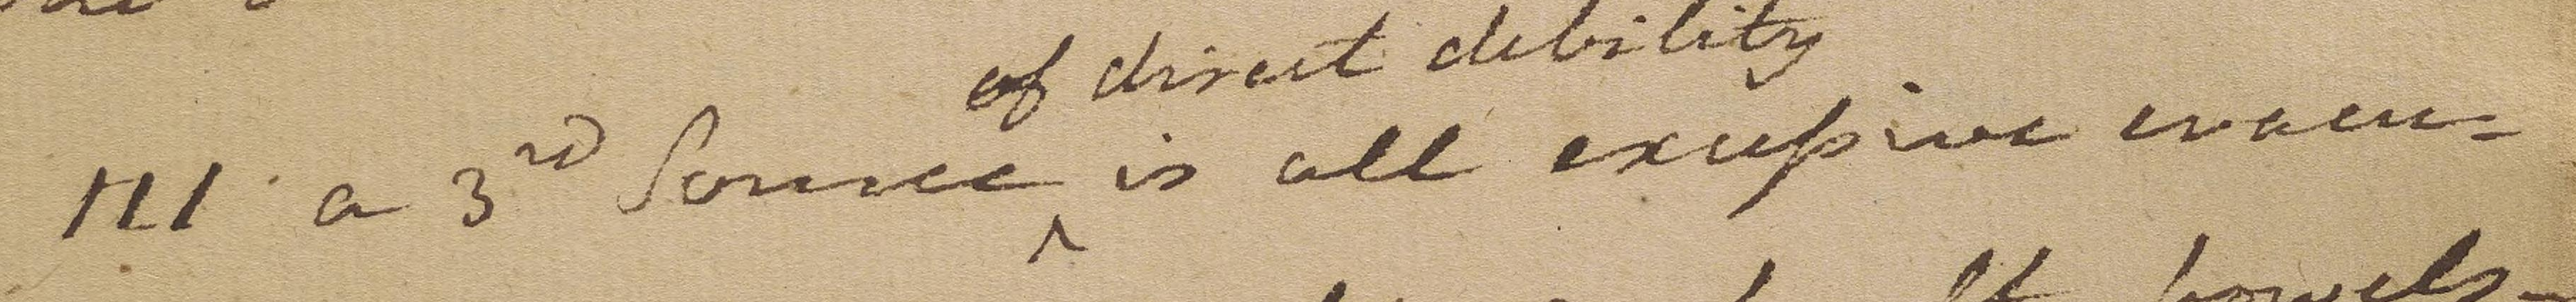III a 3^rd source ^ is all excessive evacu
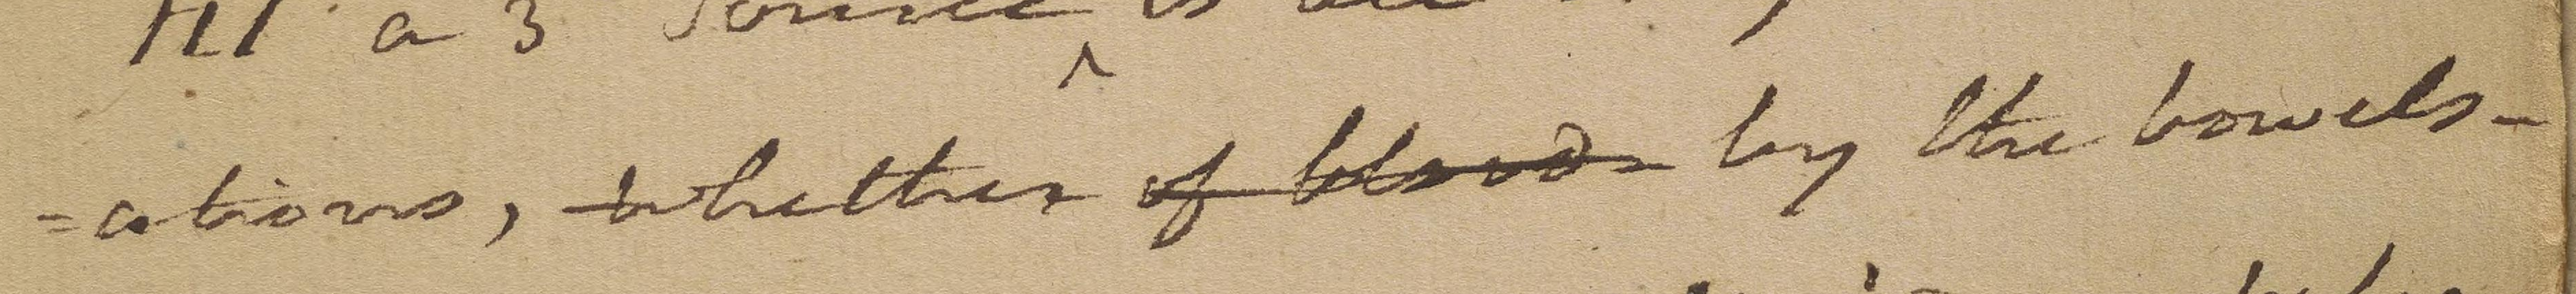-ations, whether [of blood] by the bowels-
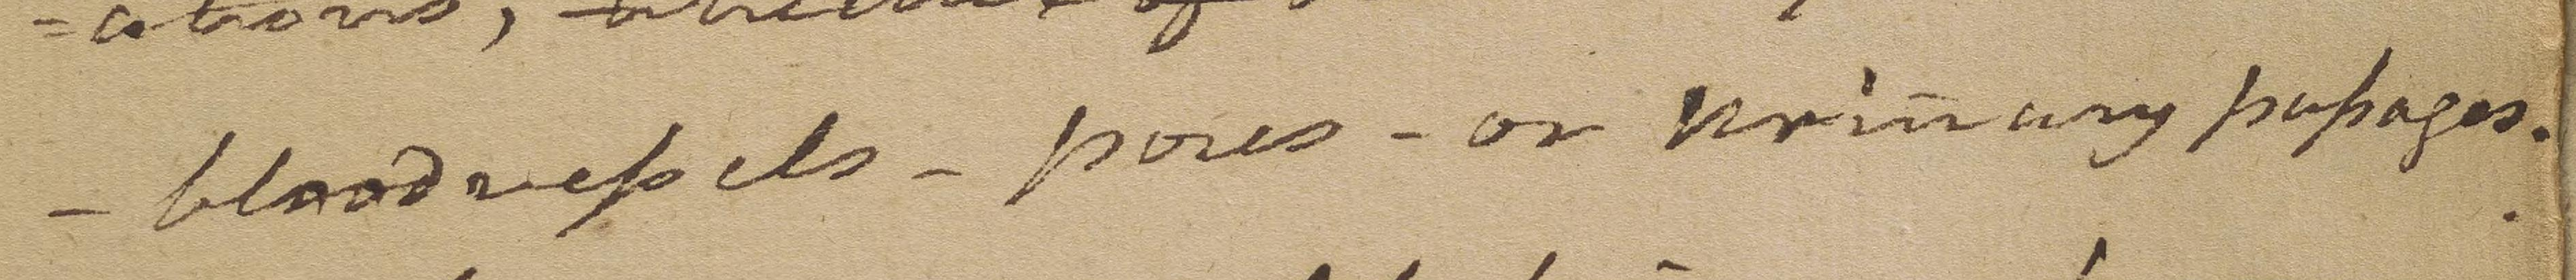-blood vessels- pores- or urinary passages
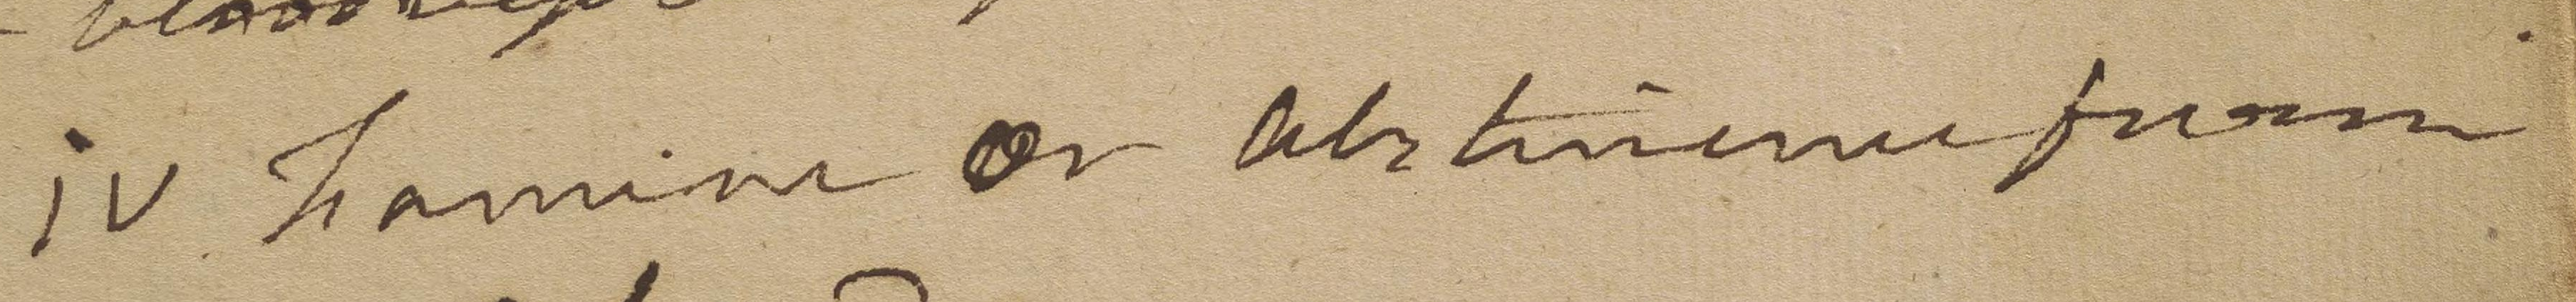IV Famine or Abstinence from
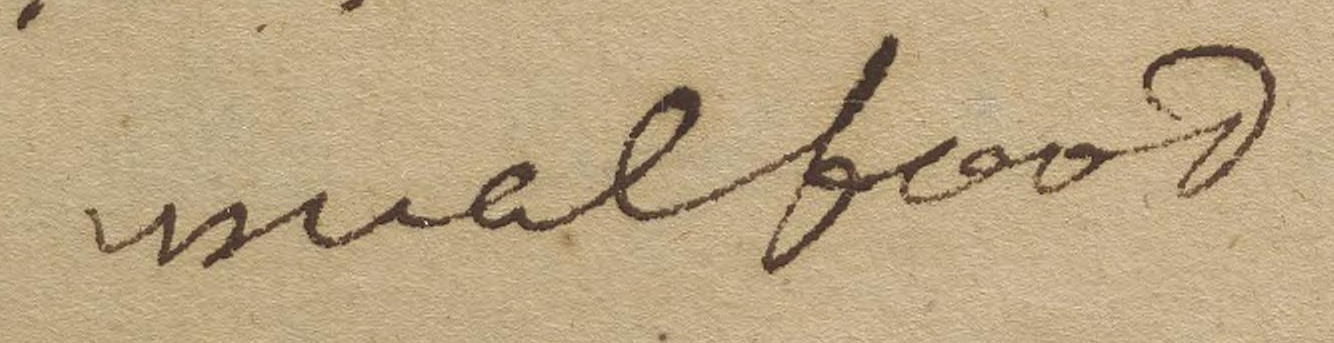meal food
